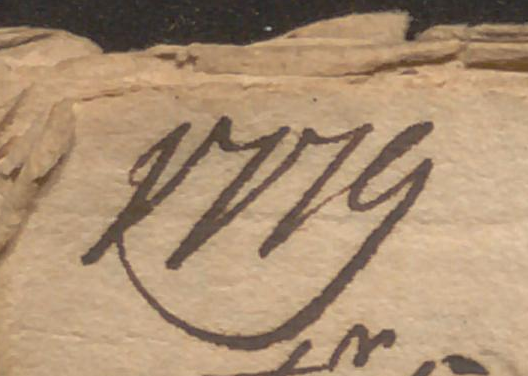1779
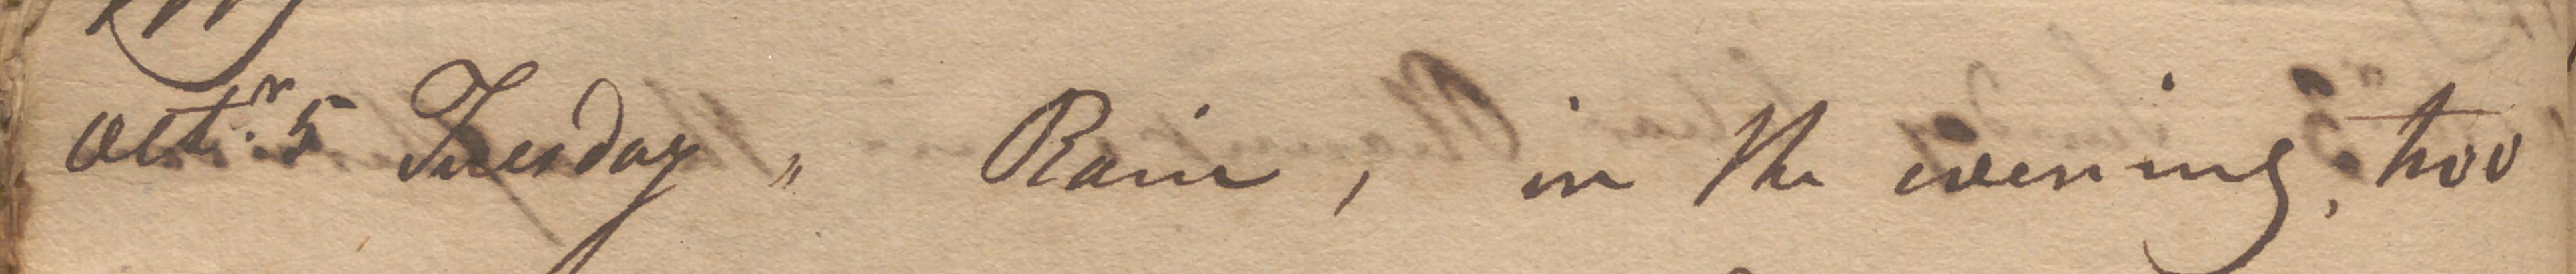Oct^r. 5 Tuesday, Rain, in the evening two
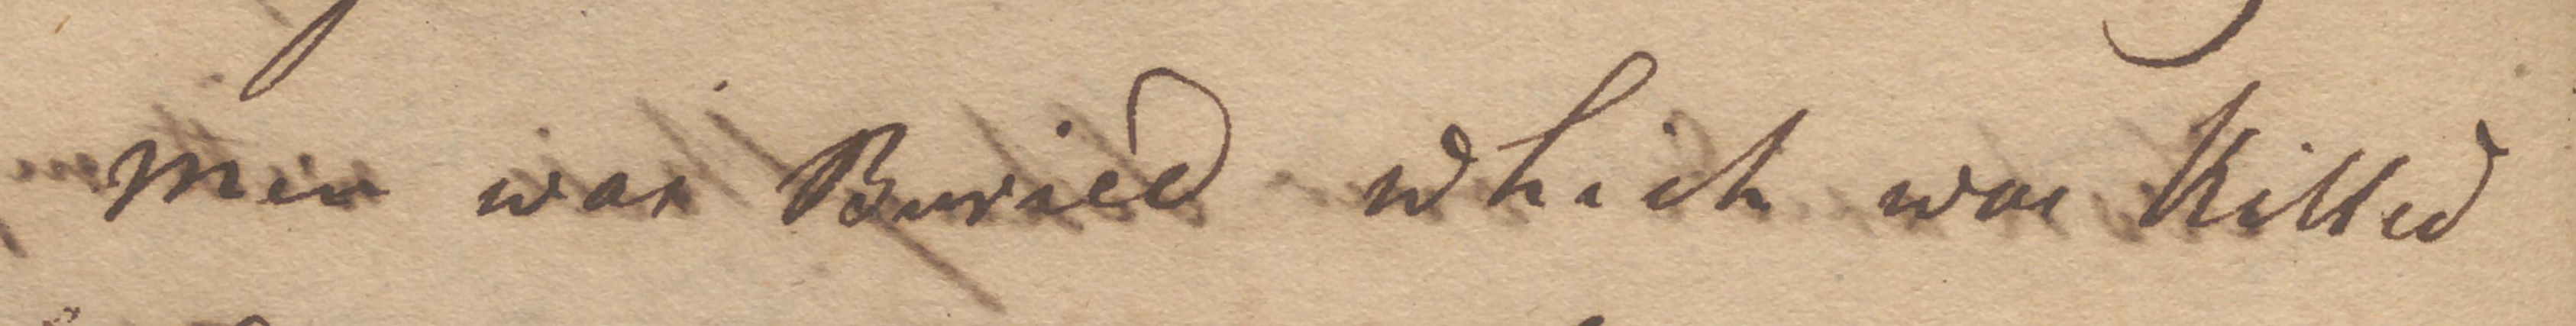men was Buried which was Killed
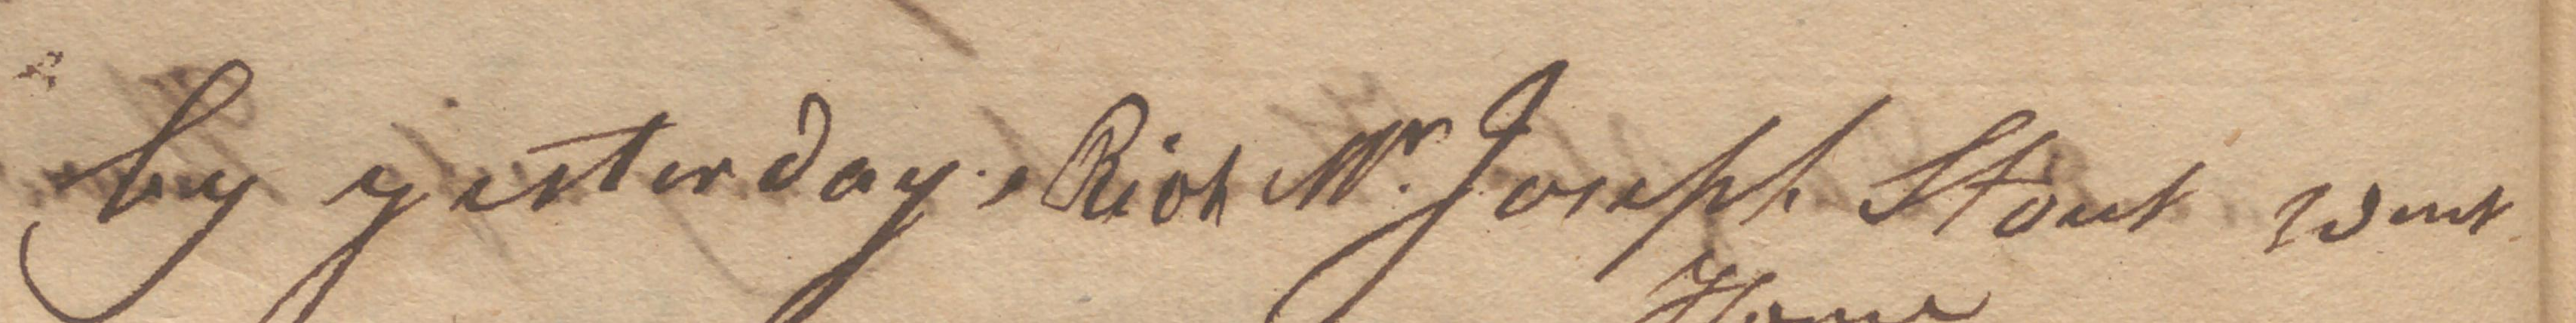by yesterdays Riot M^r. Josph Stout went
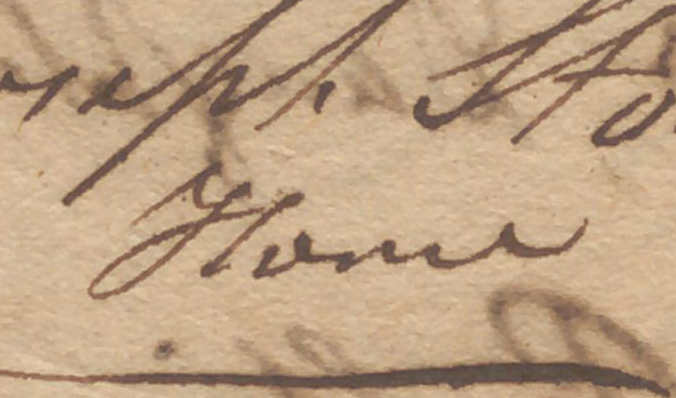Home
